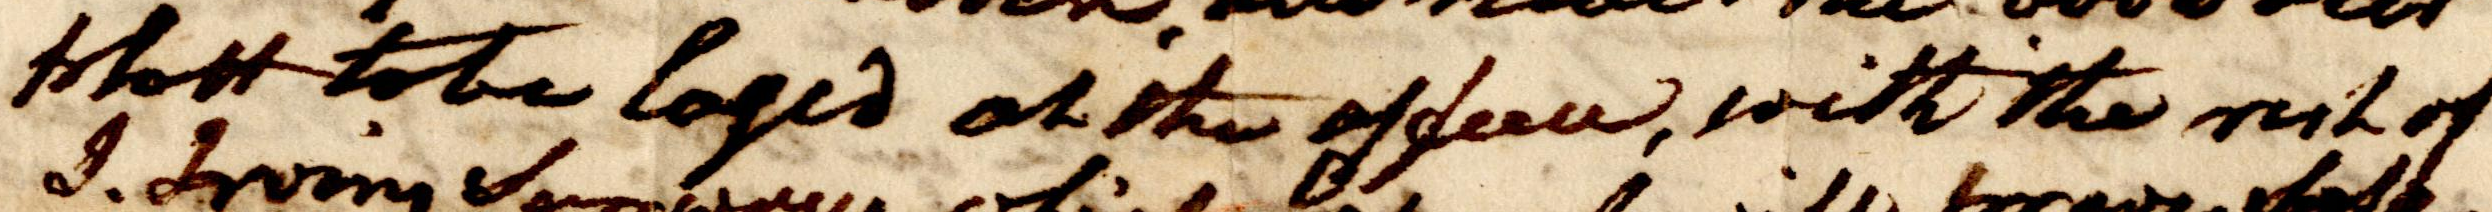plott to be loged at the offece, with the rest of
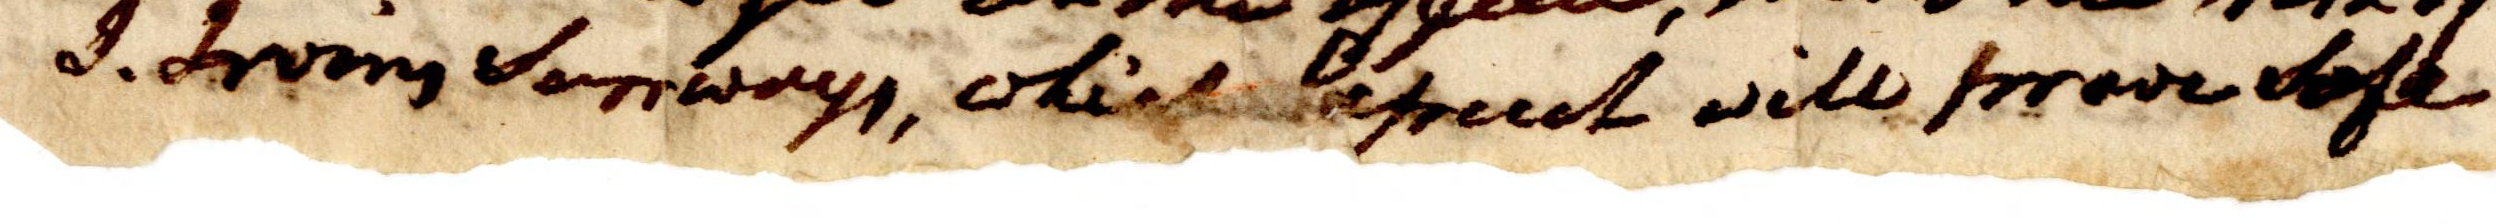S. Irving Sarrways, which Expect sill prove safe-
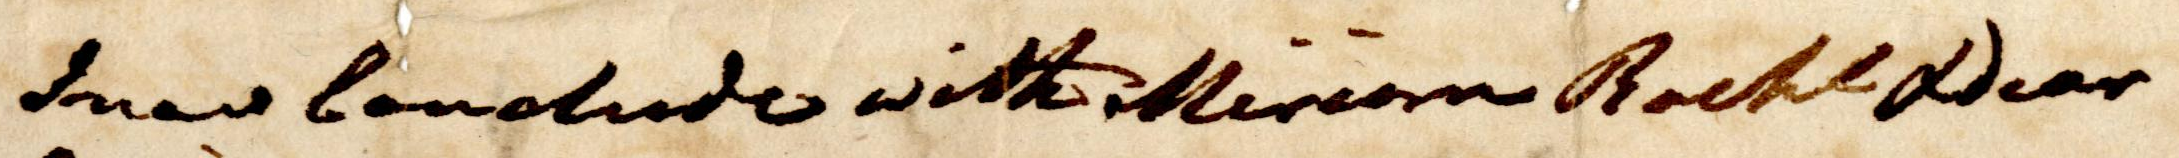I now Conclude with Miriam Rach^l & dear
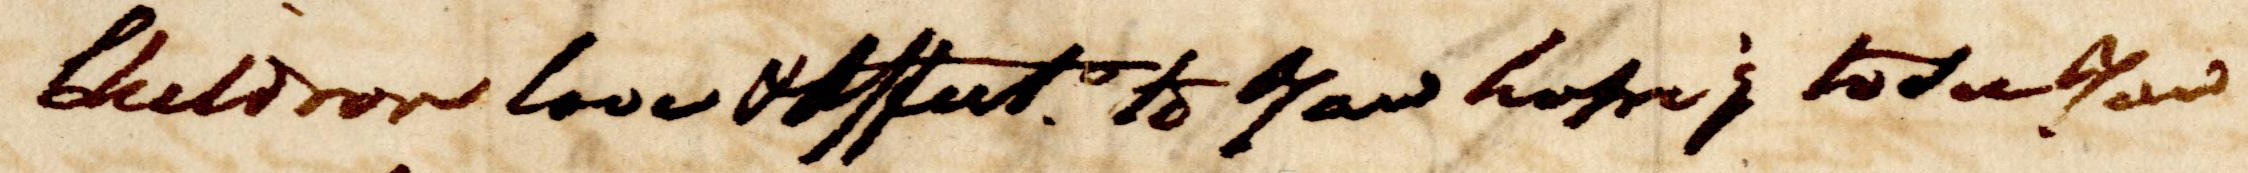Children love & affect^s to you hope^g to see you
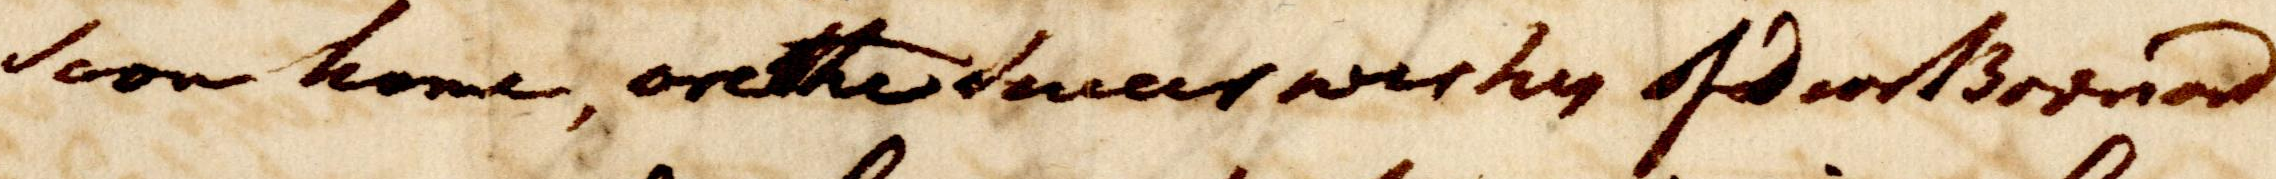soon home, are the sincere wishes of Dear Barnard
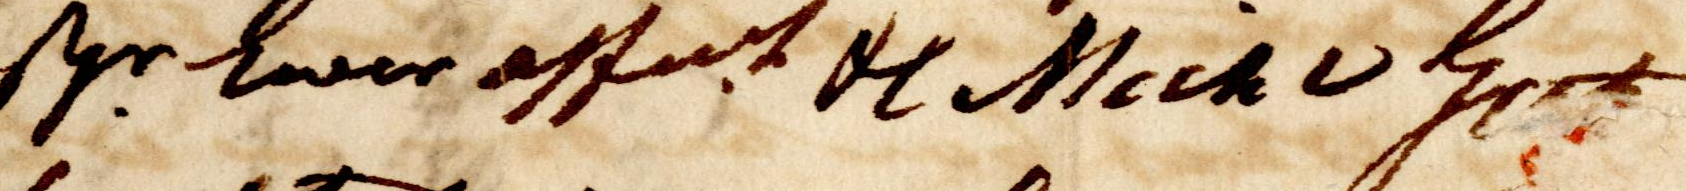y^r ever affec^t. &C Mich^l Gratz
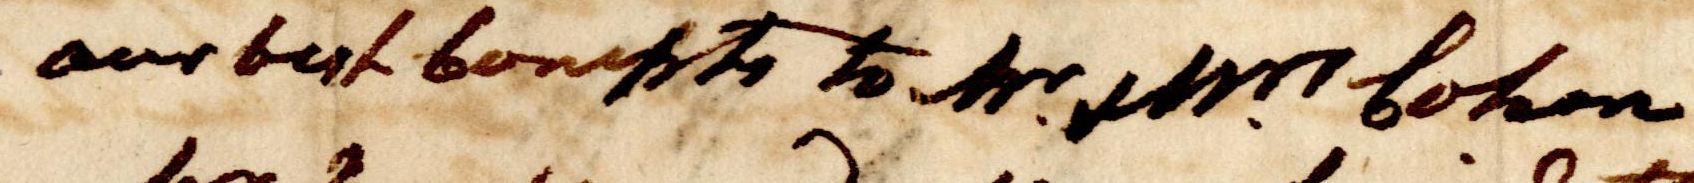our best Compts to M^r & M^rs Cohen
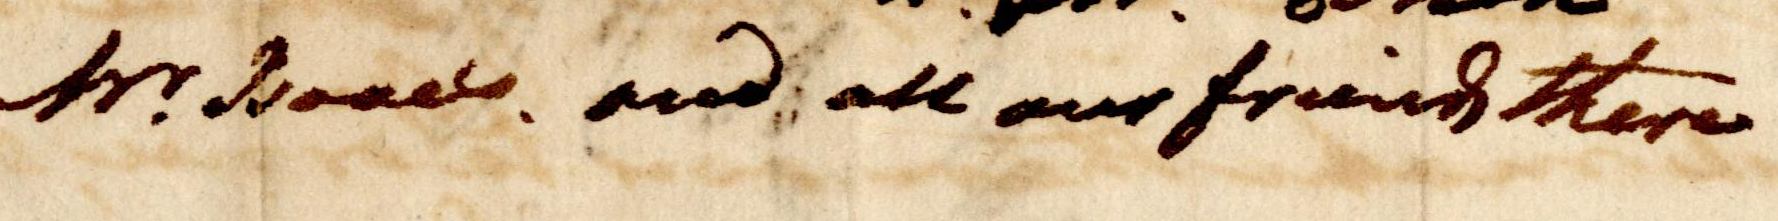M^r Franks. and all our friends there
